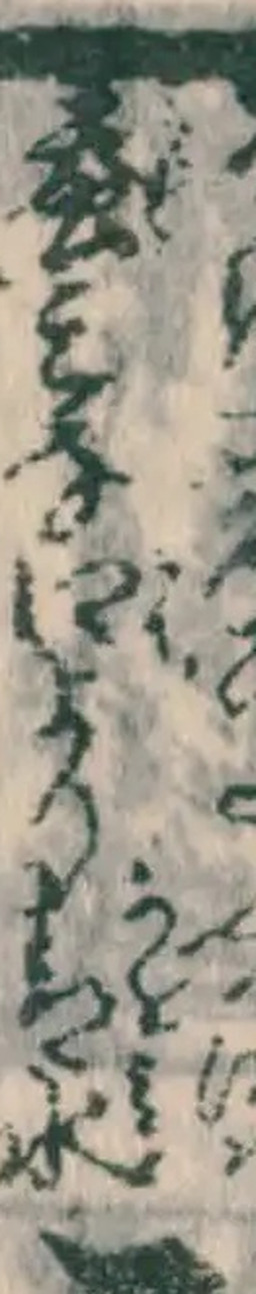蚕みな口より青水
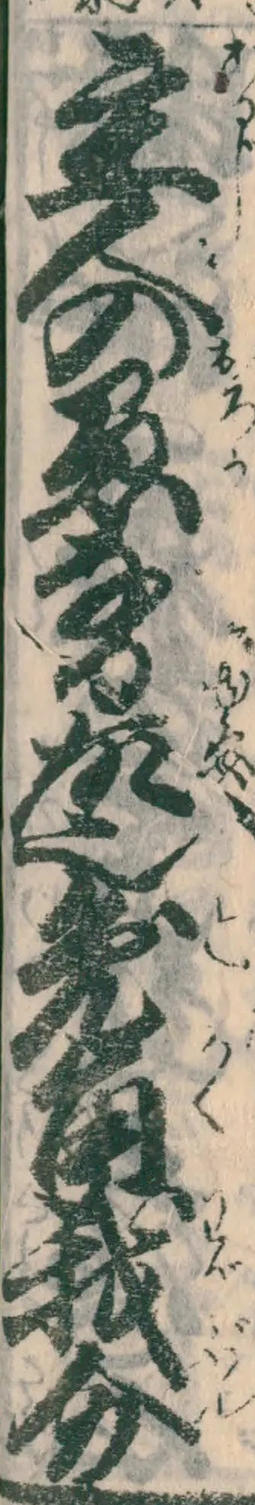主人の愚なる故也兎角我分
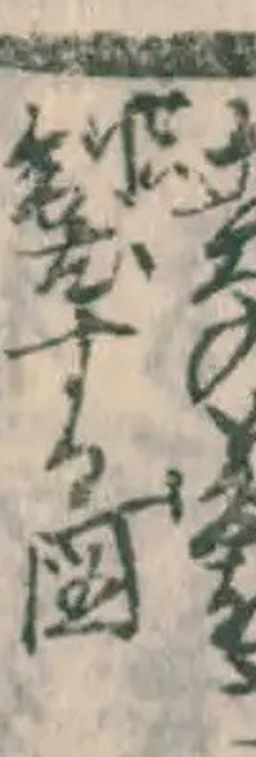製する図
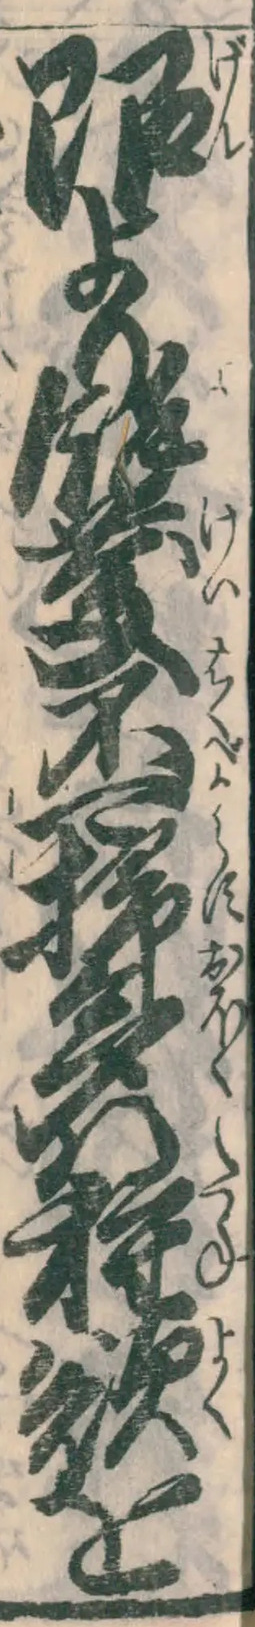限より餘慶不可掃多は種欲を
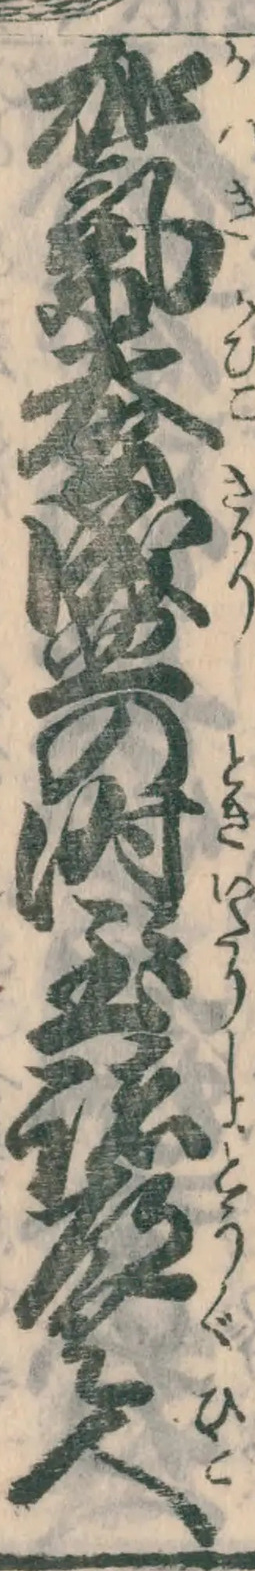加気蚕盛の時に至諸道具人
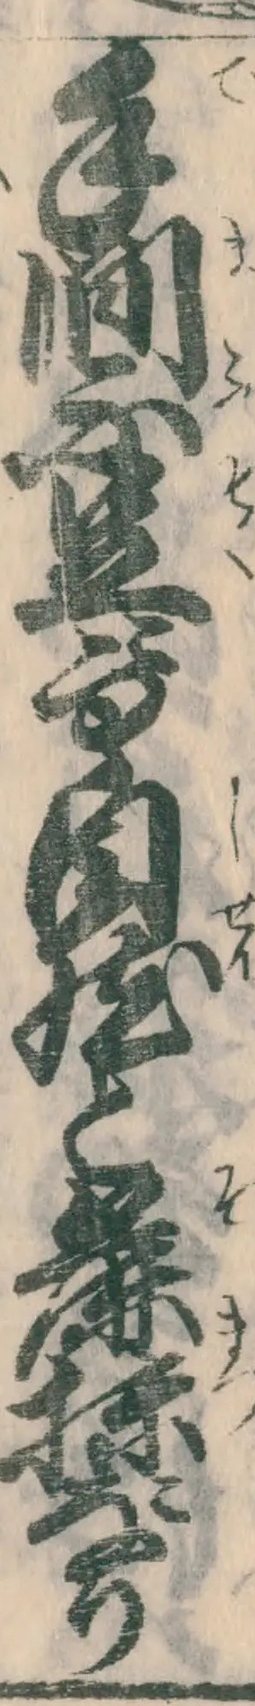手間不足にて自然と麁抹になり
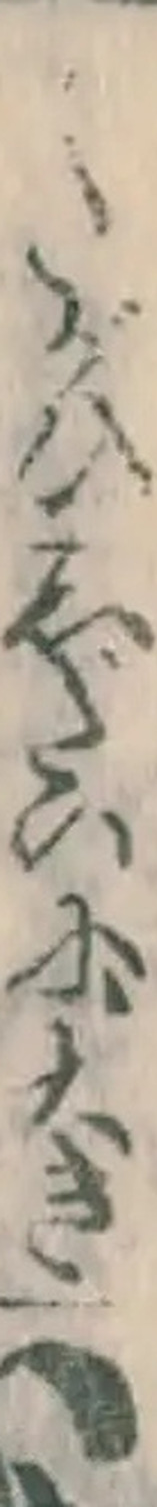したがひしだいに大き
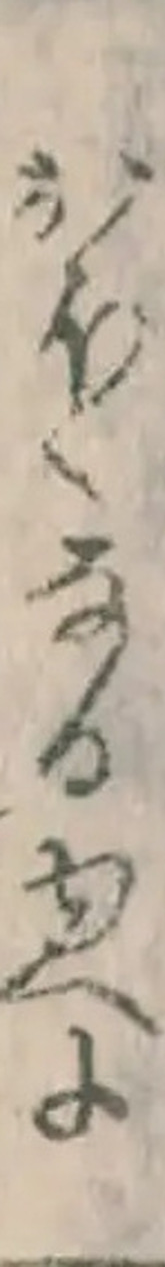おほくなるゆへに
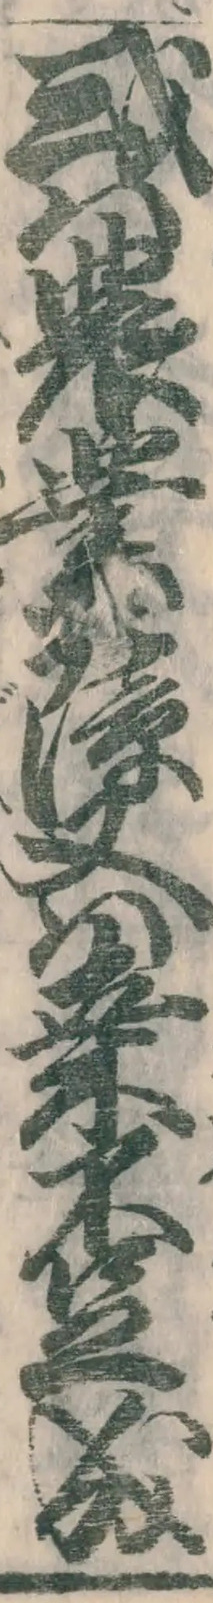或は農業障又は桑不足成
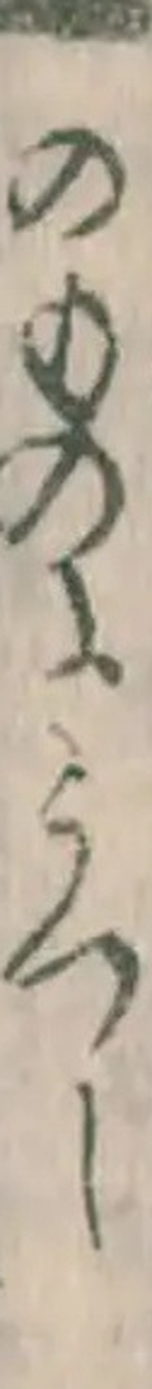のものにうつし
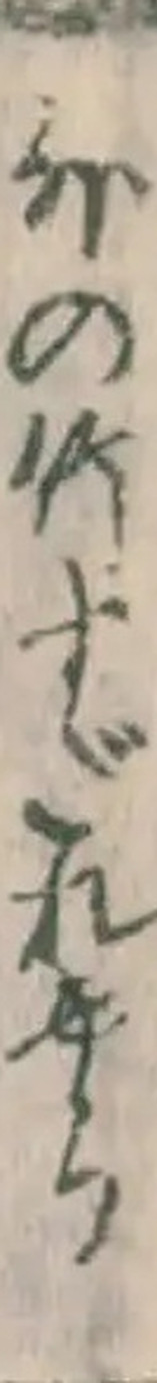外の竹すだれやら
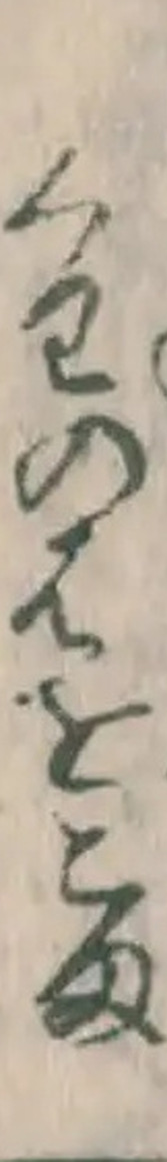くわのはをこま
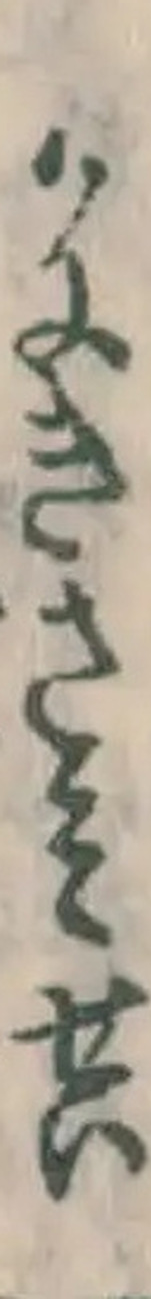かにきさみせい
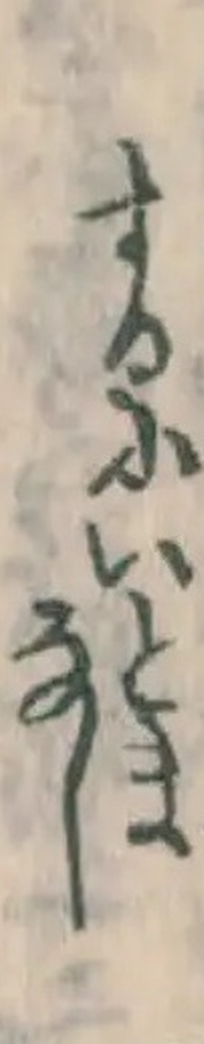するにいとまなし
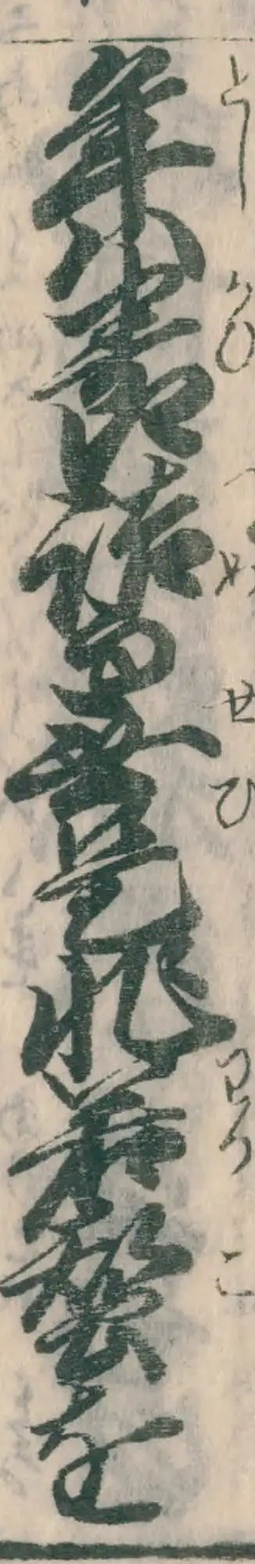年は養詰て無是非若蚕を

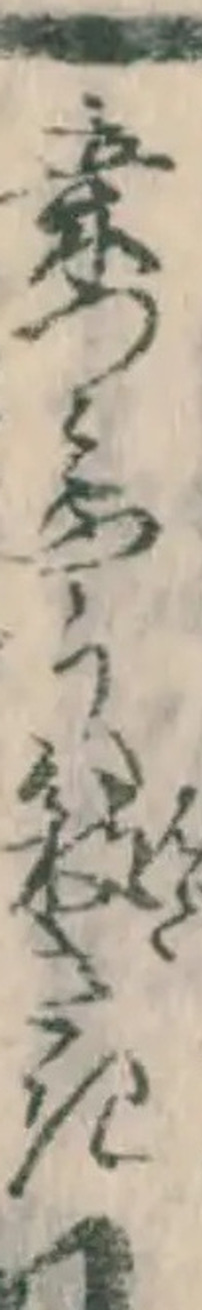桑つみやうは枝さき
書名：養蚕往来
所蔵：国立国会図書館 National Diet Library, JAPAN
